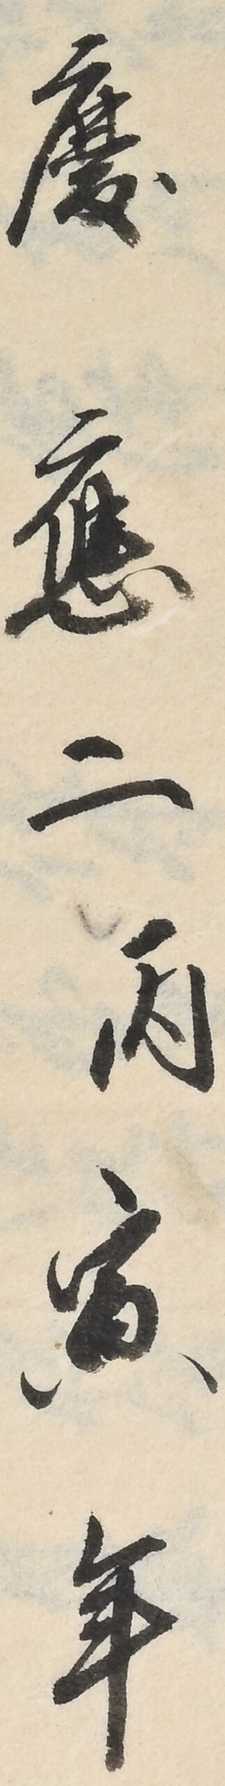㊞慶応二丙寅年
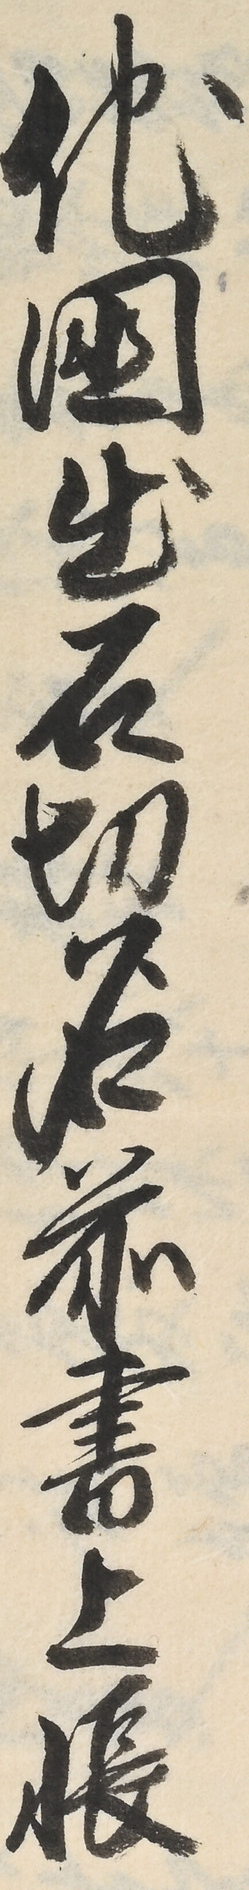他国出石切名前書上帳

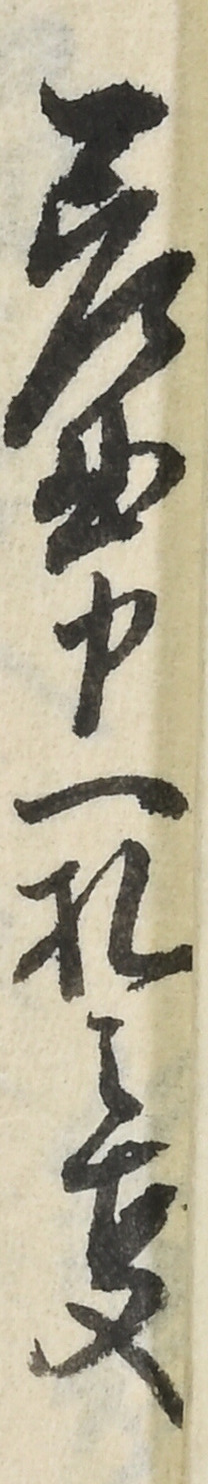差出申一札之事
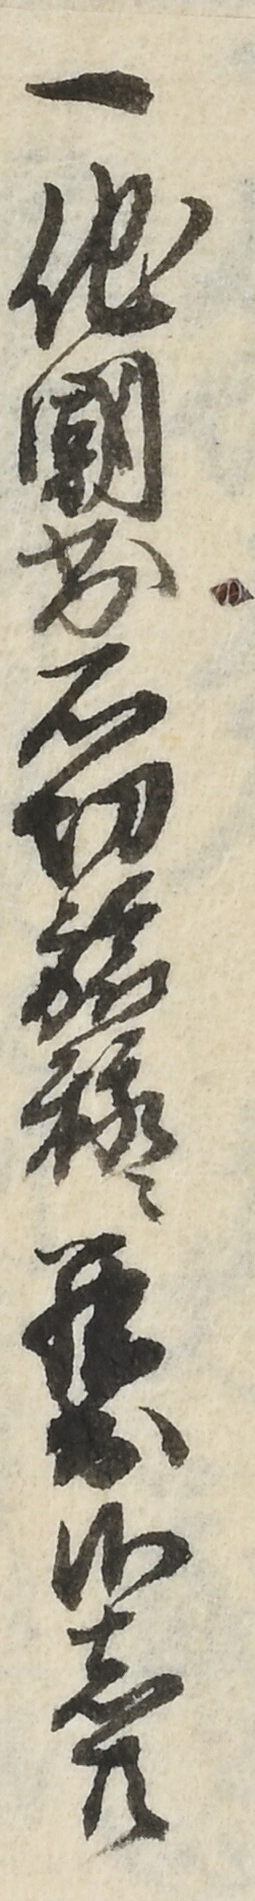一他国出石切旅稼ニ罷出候者共
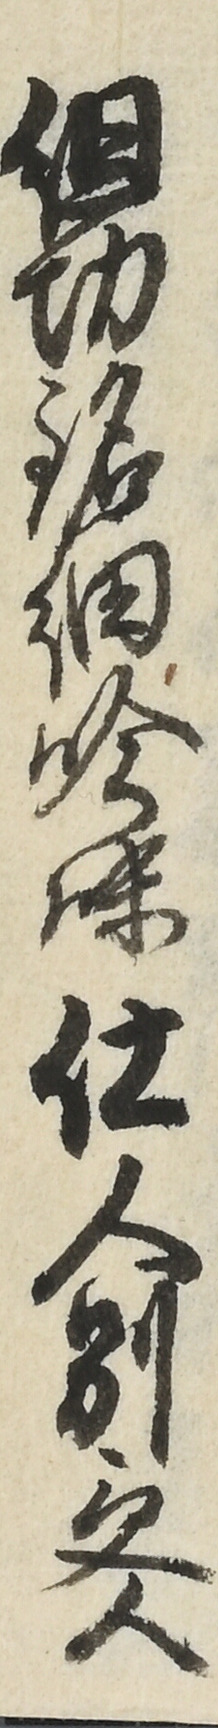組切銘細吟味仕人別受人
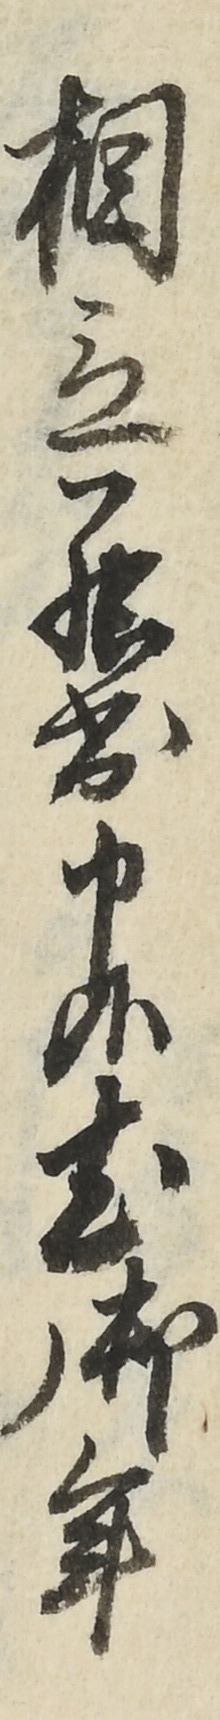相立罷出申候尤御年
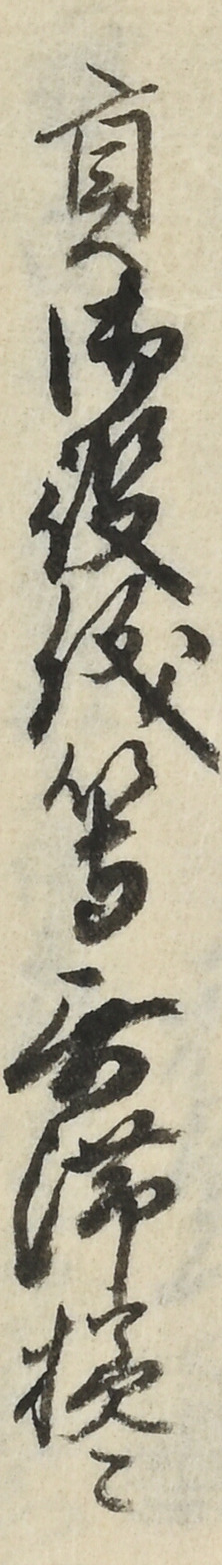貢御役儀等無滞様ニ
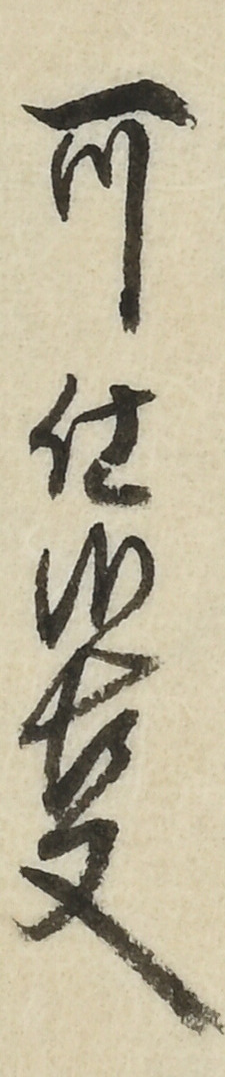可仕候事
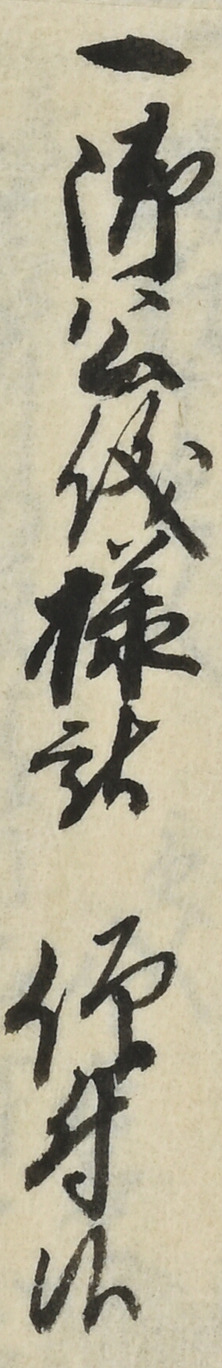一御公儀様被仰付候

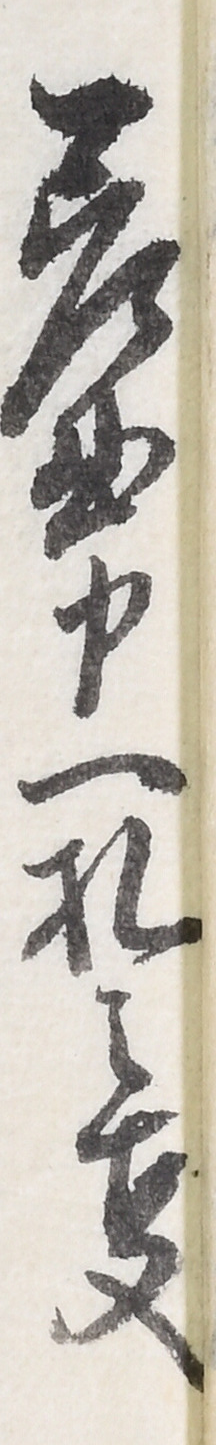差出申一札之事
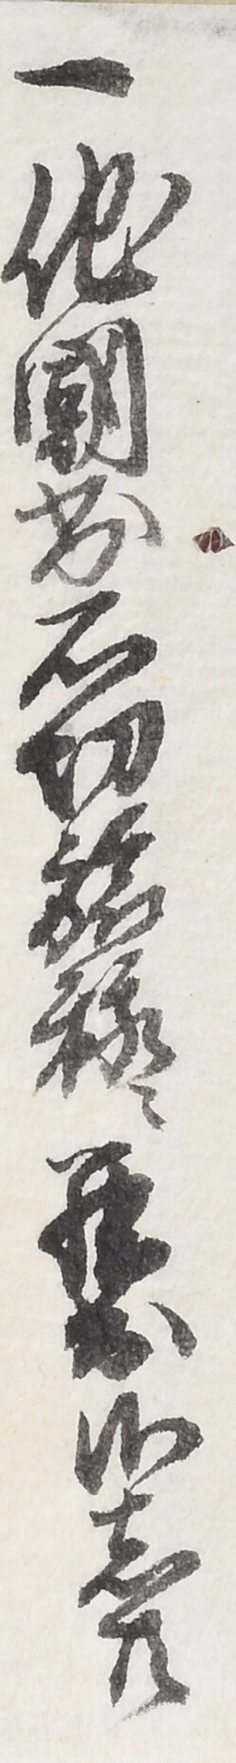一他国出石切旅稼ニ罷出候者共
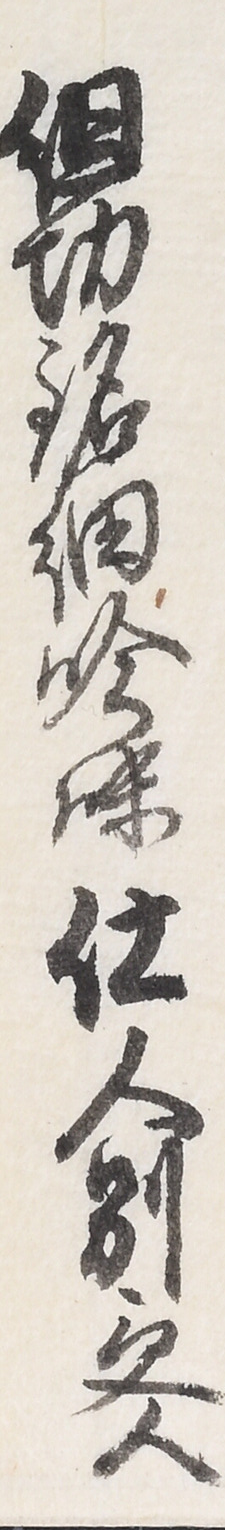組切銘細吟味仕人別受人
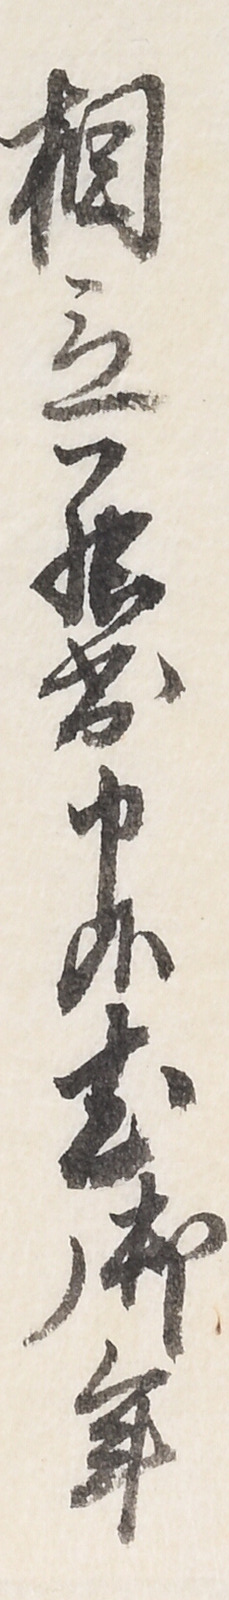相立罷出申候尤御年
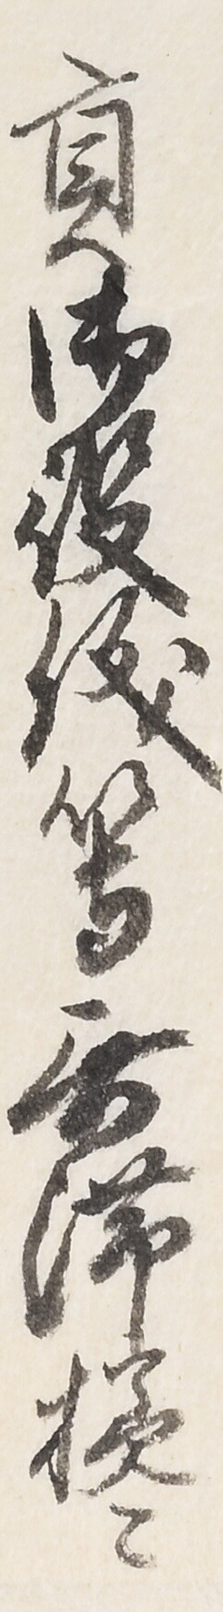貢御役儀等無滞様ニ
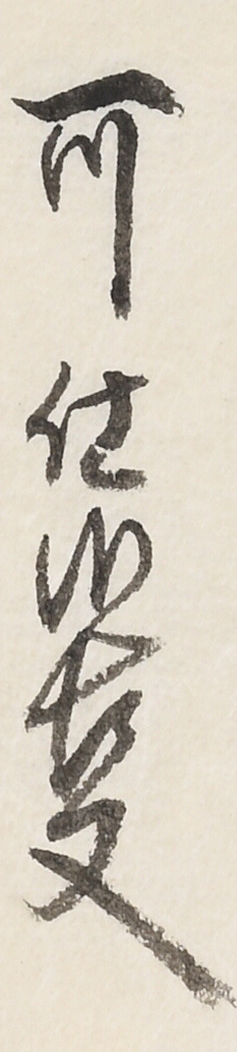可仕候事
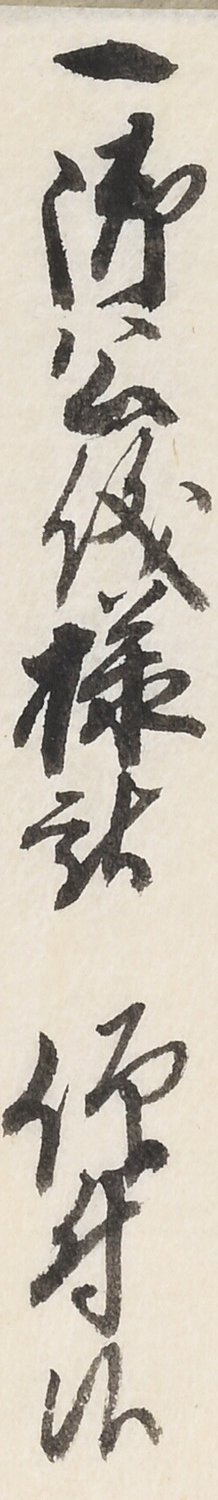一御公儀様被仰付候
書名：慶應二丙寅年二月他國出石切名前書上帳
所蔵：伊那市立高遠町図書館・合同会社AMANE
